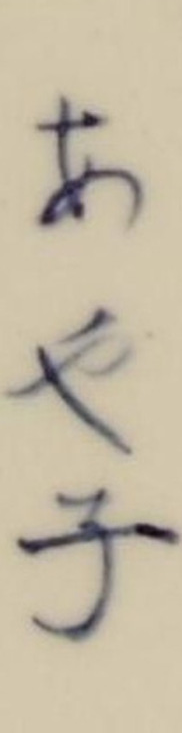あや子
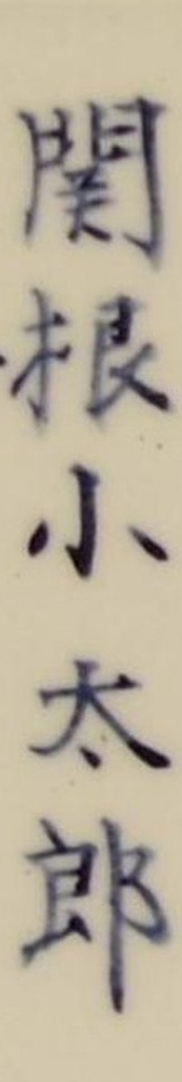関根小太郎
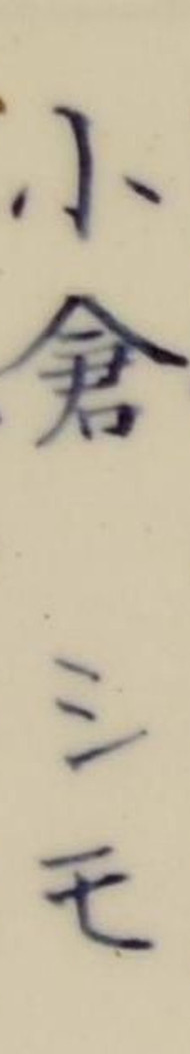小倉シモ
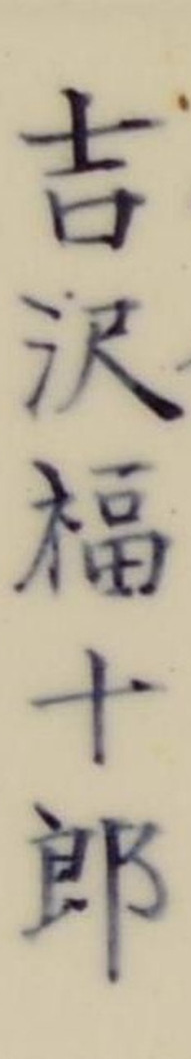吉沢福十郎
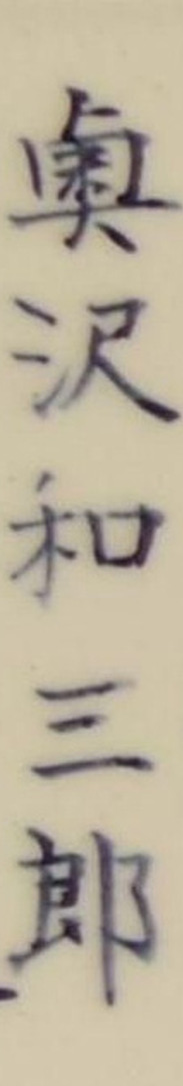奥沢和三郎
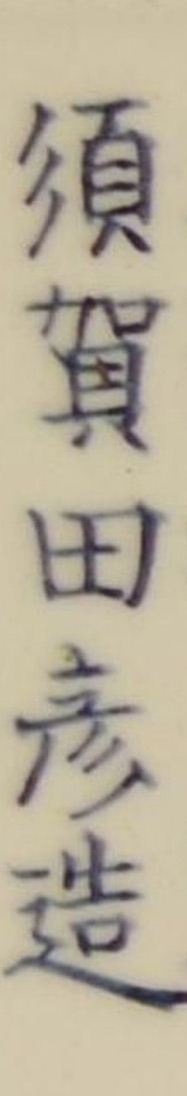須賀田彦造

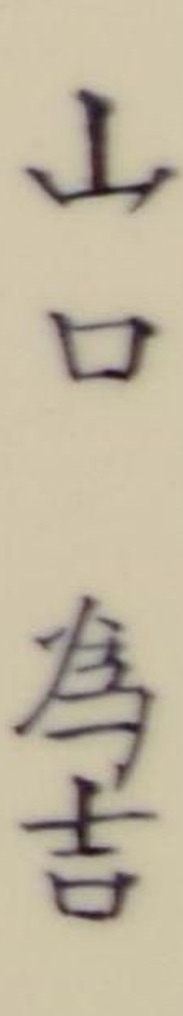山口為吉
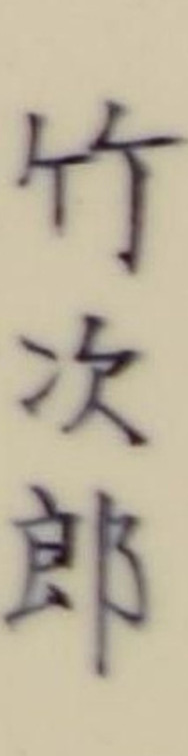竹次郎
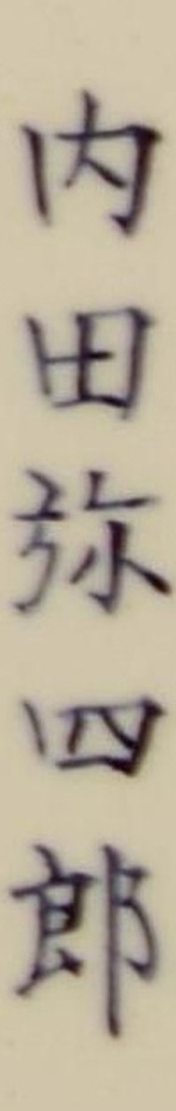内田弥四郎
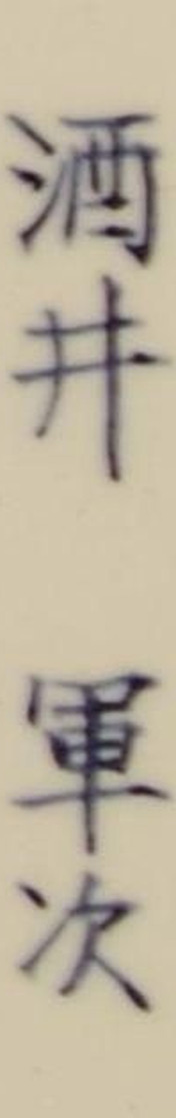酒井軍次
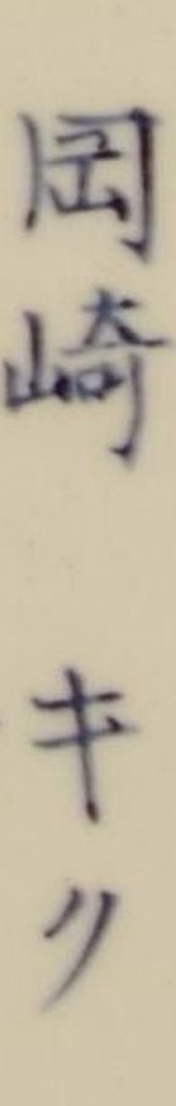岡崎キク
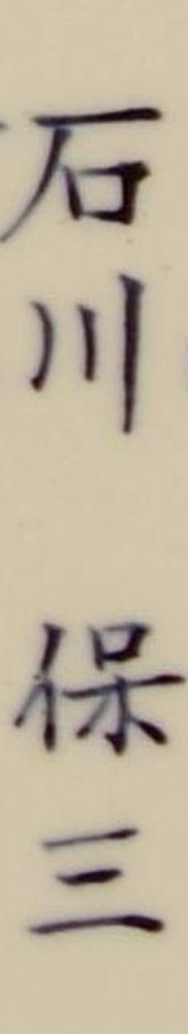石川保三
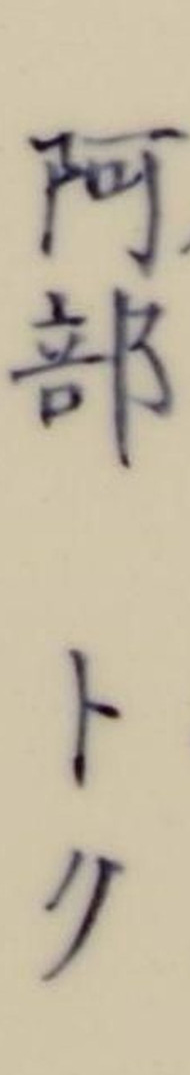阿部トク
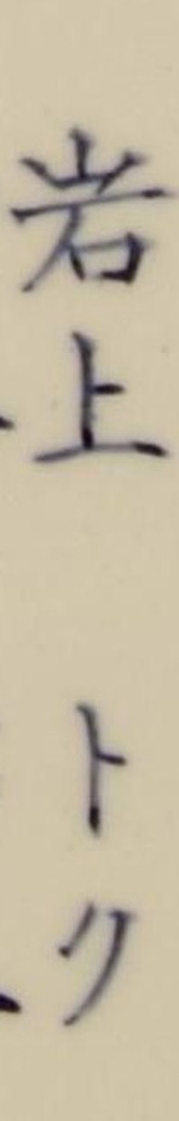岩上トク
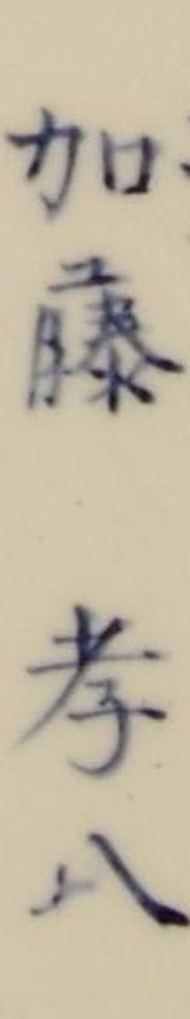加藤孝八
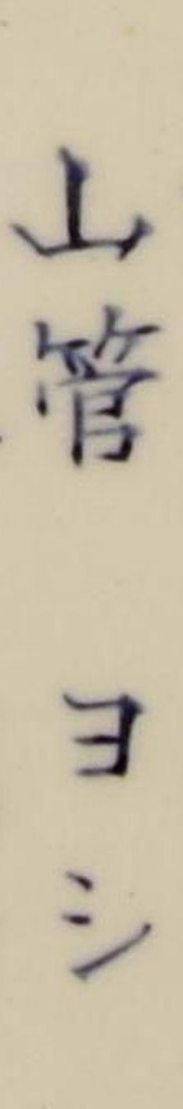山管ヨシ
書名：E~L
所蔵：高野山金剛峯寺
